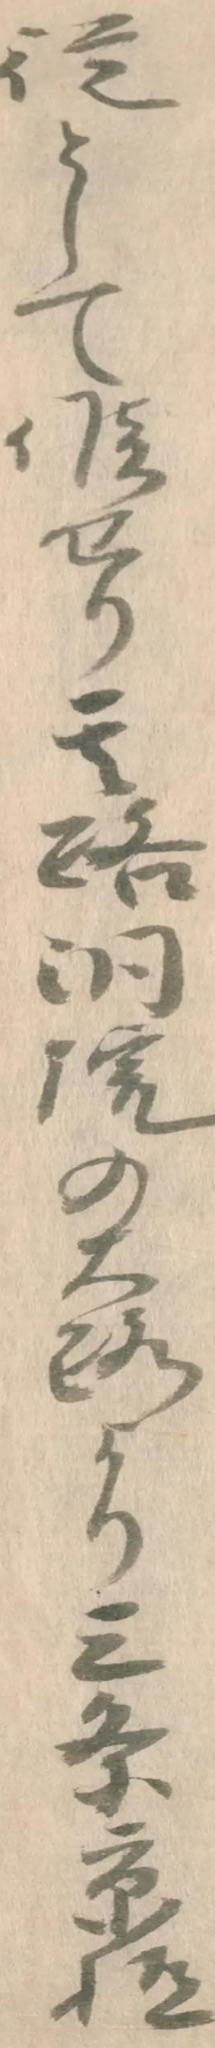従として候せり其路洞院の大路より三条京極
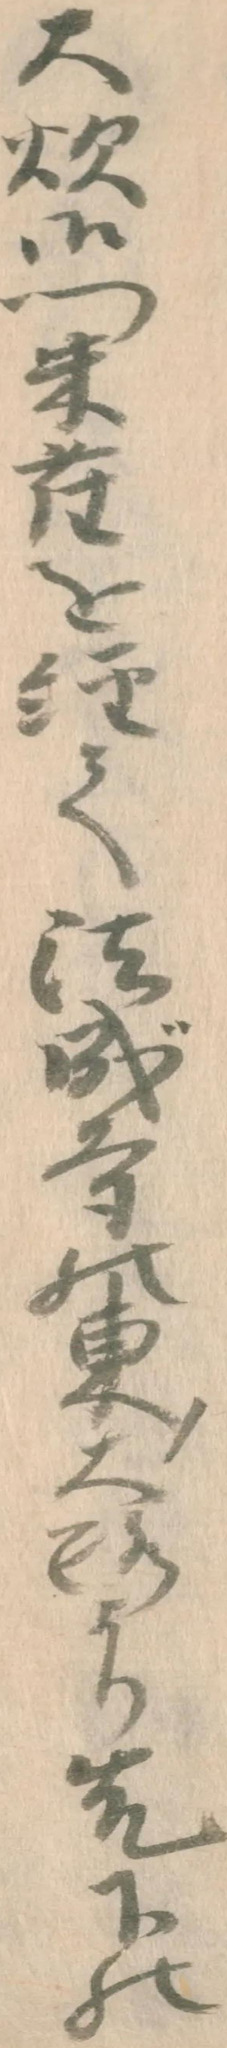大炊御門朱雀を経て法成寺の東大路より先下の
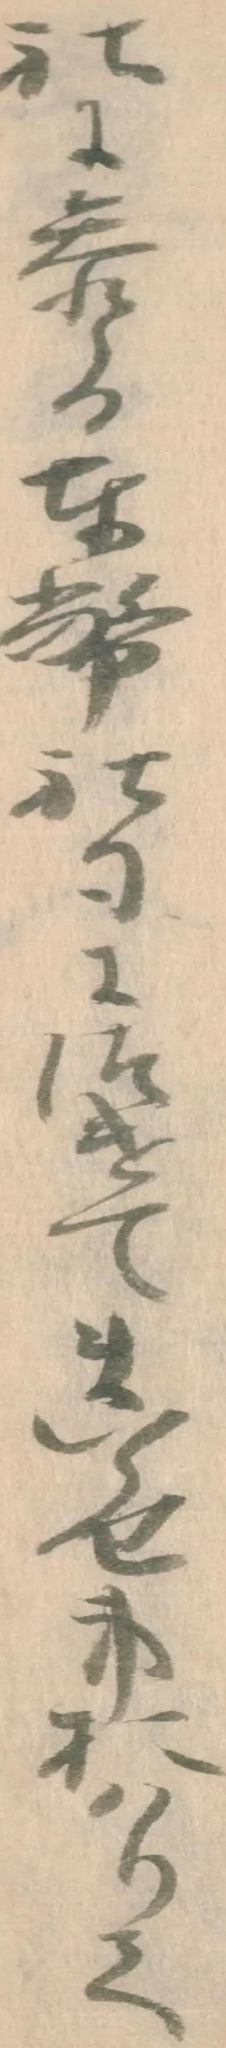社に参らる奉幣社司につけてまいらせ事おはりて
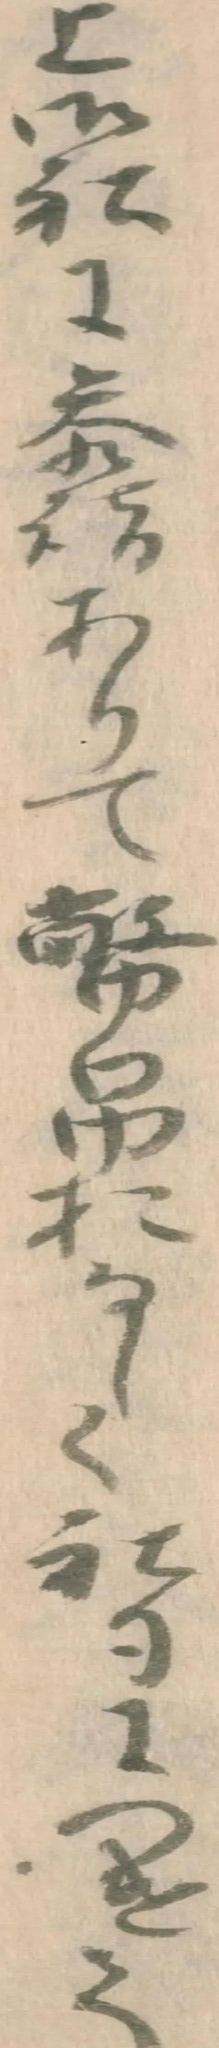上御社に参詣ありて幣帛おなしく社司につけて
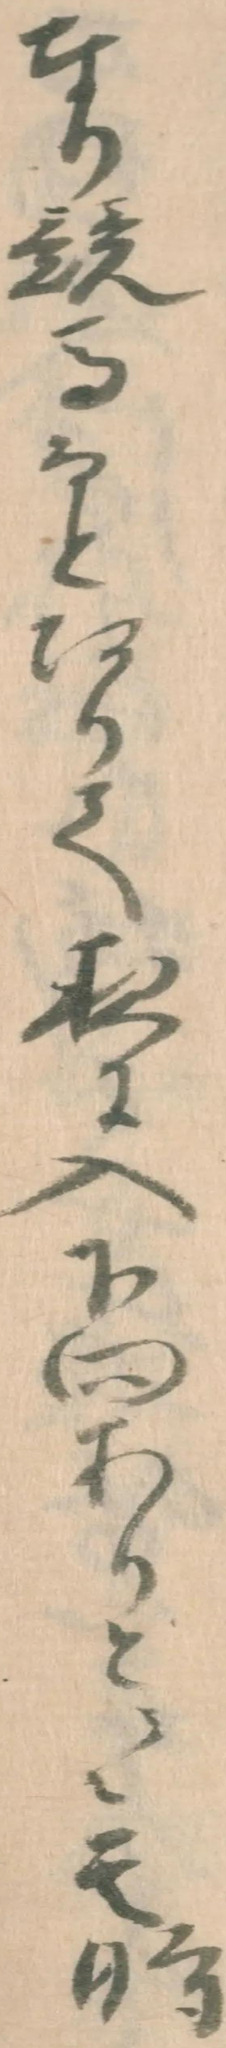奉り競馬なとありて夜に入下向ありと云々其時
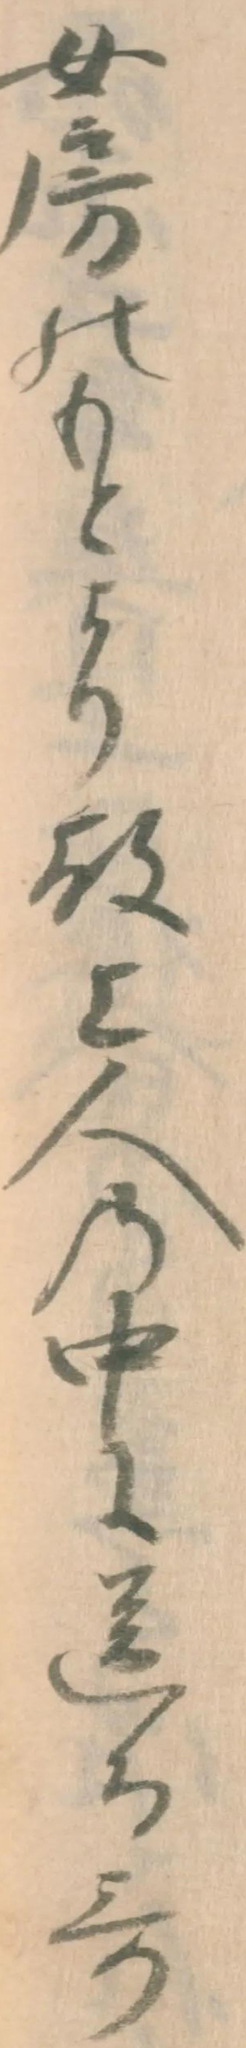女房のもとより殿上人の中に送る哥
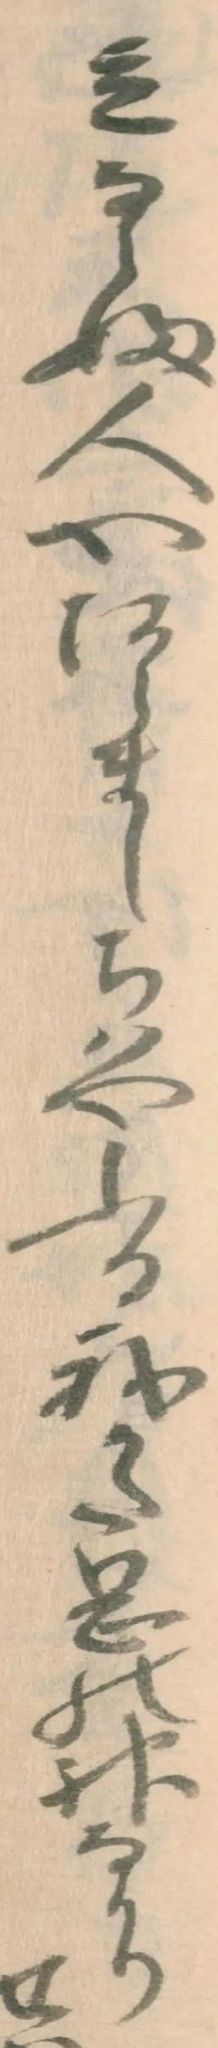立ならふ人やあらましちはやふる我かた岡の神なかりせは
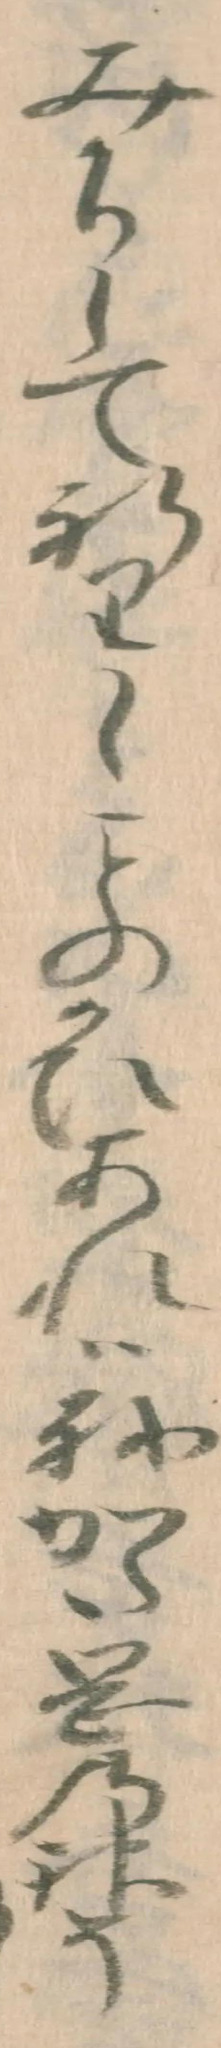みかりして祈りしことのかひあれは我かた岡の神そうれしき
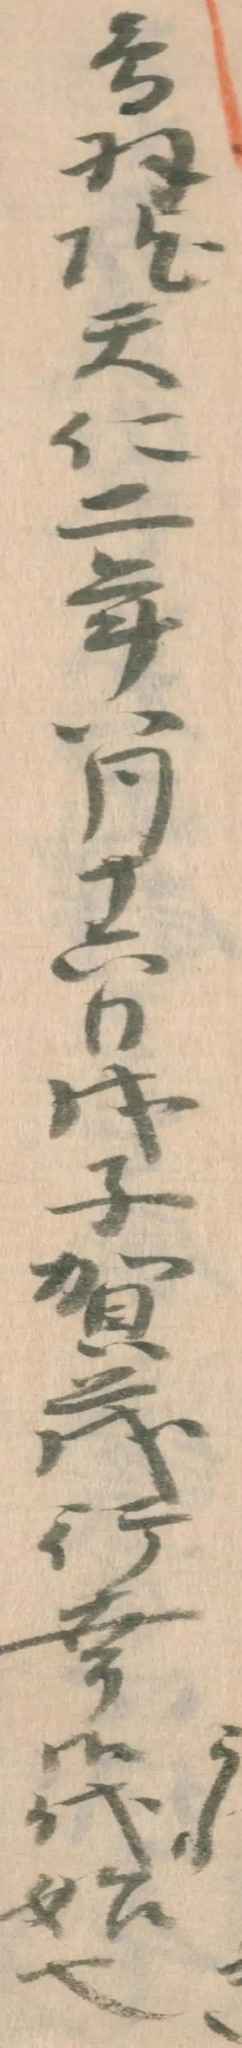鳥羽院天仁二年八月十六日戊子賀茂行幸御代始也
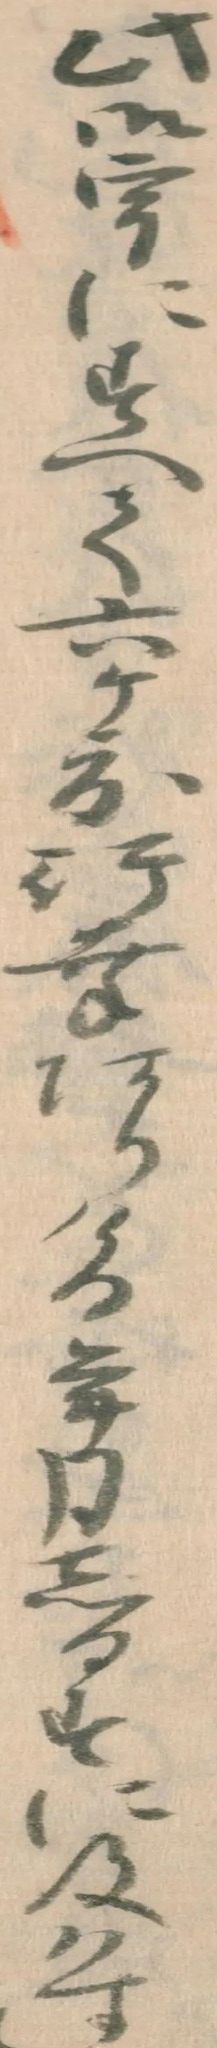此御宇にすへて六ヶ度行幸ありける年月しるすに及はすもらしつ
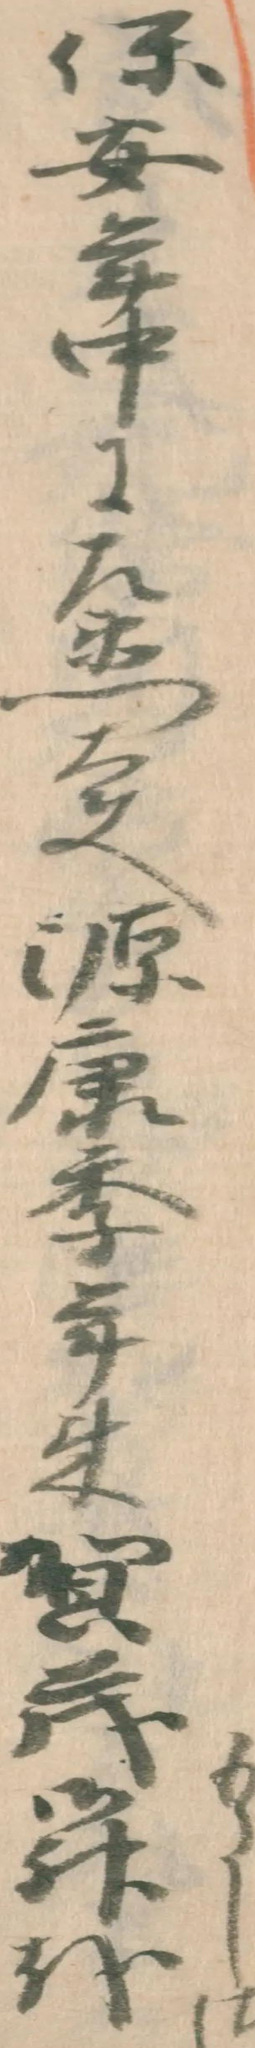保安年中に左衛門大夫源康季年来賀茂御神を
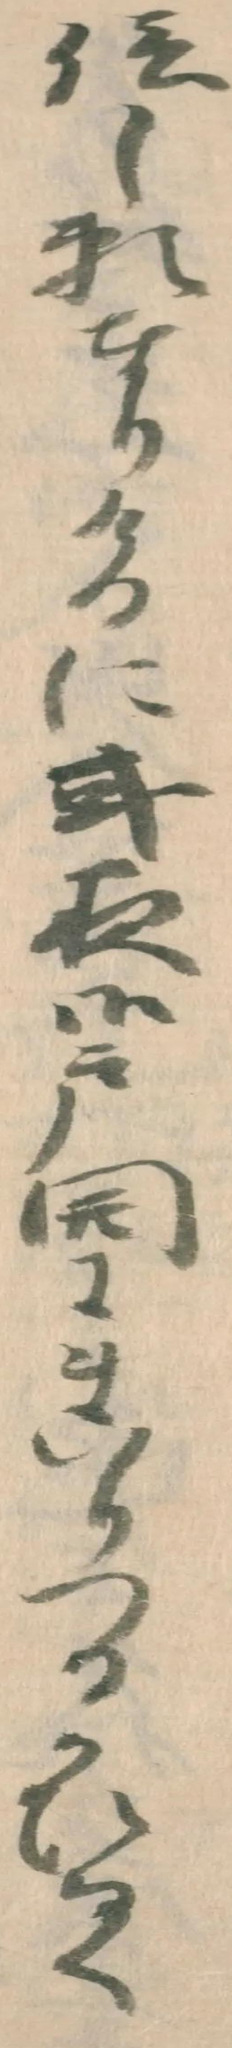信し頼奉りけるに或夜御戸開にまいりつるかひなくかも
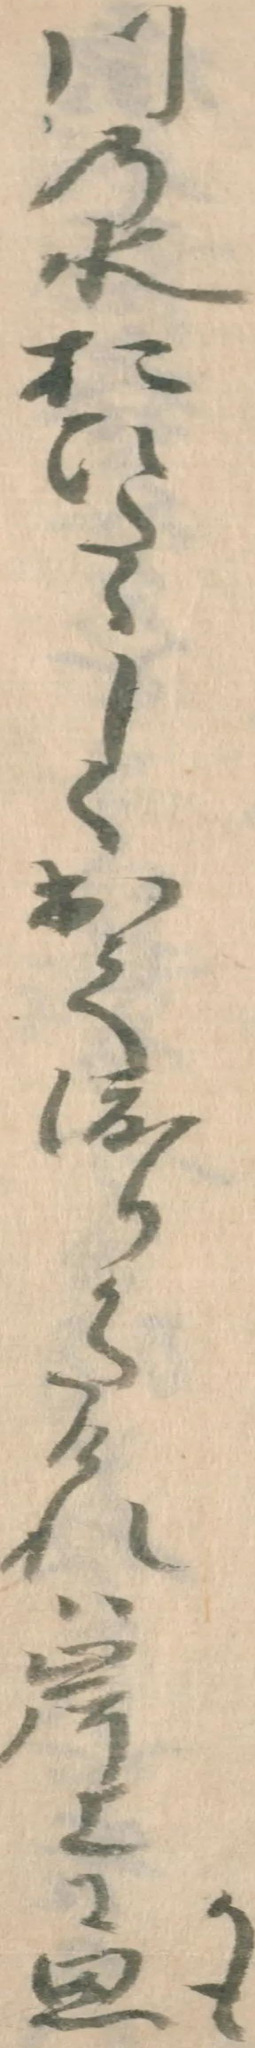川の水おひたゝしく出て渡りかたけれは岸上に思
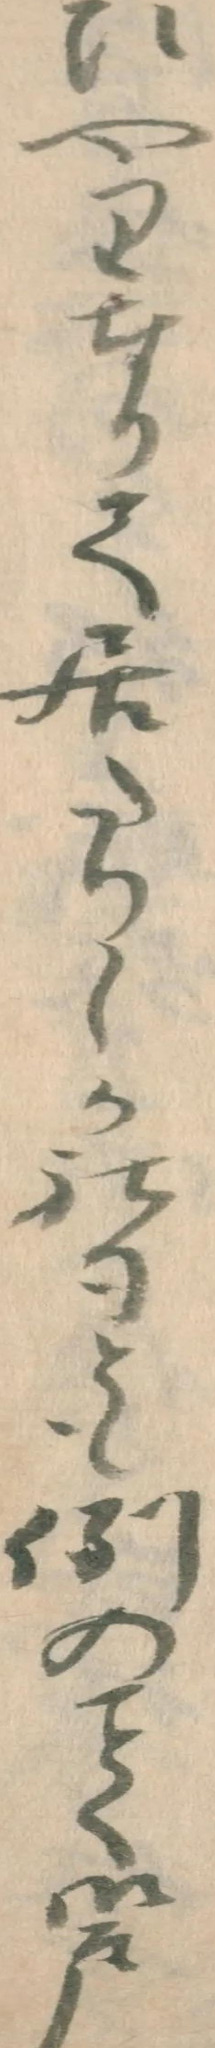ひやり奉りて居たりしか社司とも例のことく御戸
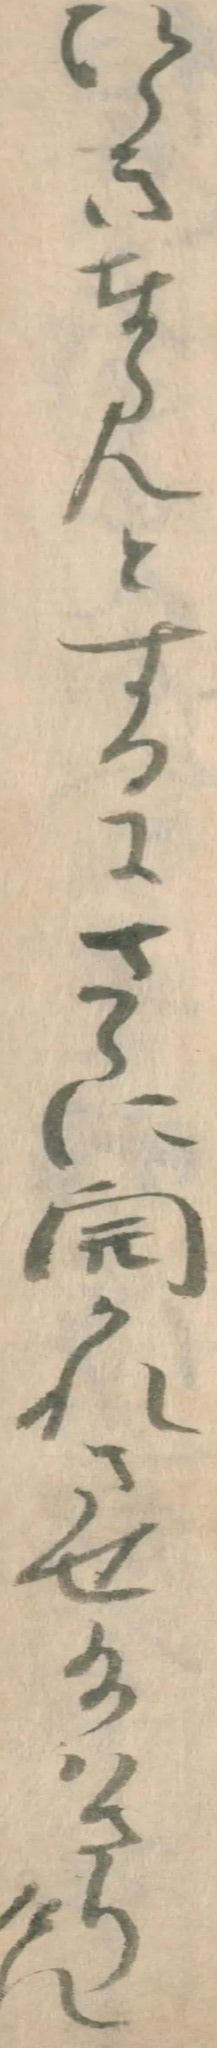ひらき奉らんとするにさらに開かれさせ給はさりけれは

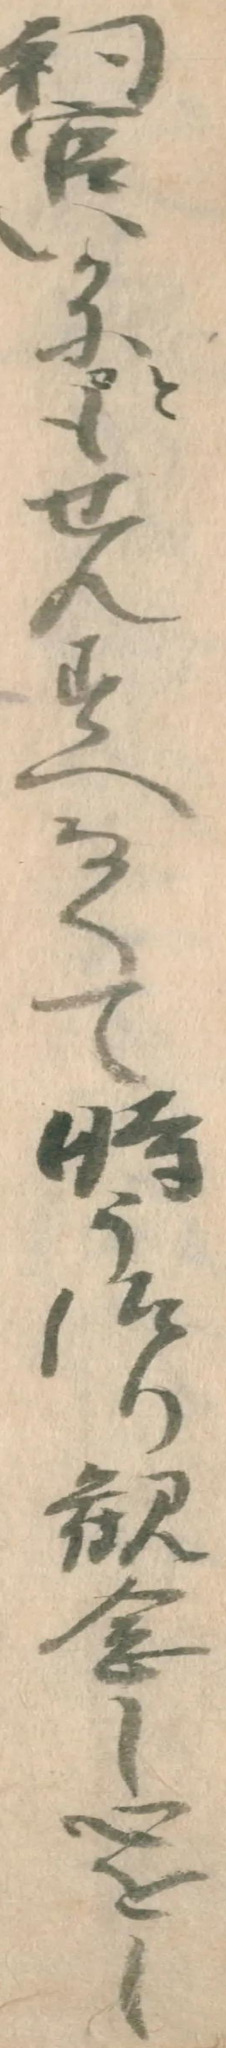祠官いかに◦もせんすへなくて時うつり観念し心をし
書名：賀茂社記録. 第1冊
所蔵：国立国会図書館 National Diet Library, JAPAN
